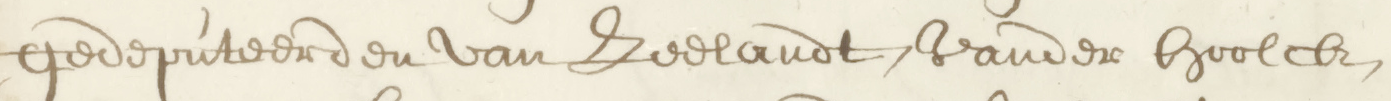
gedeputeerden van Zeelandt, vander Hoolck,
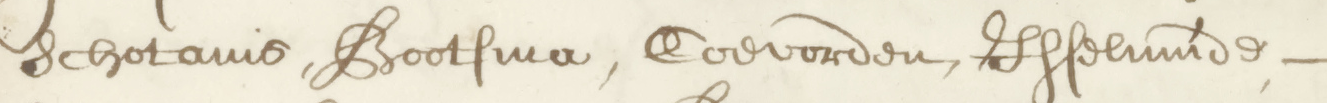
Schotanis, Bootsma, Coevorden, Isselmude,
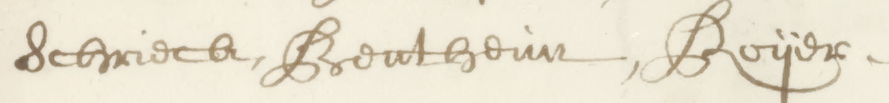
Schrieck, Bentheim, Roijer.
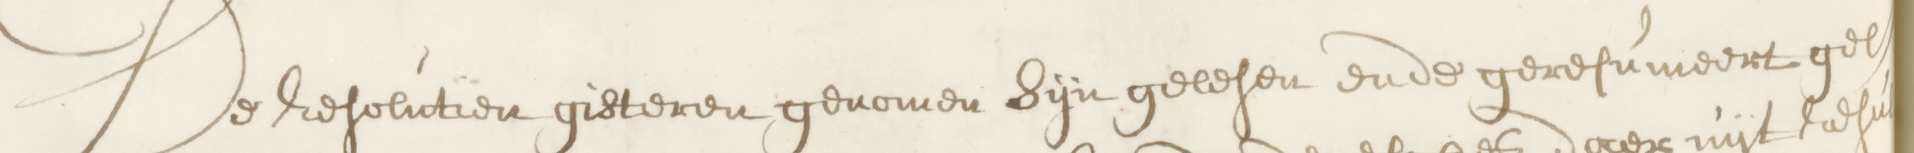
De resolutien gisteren genomen sijn gelesen ende geresumeert gel
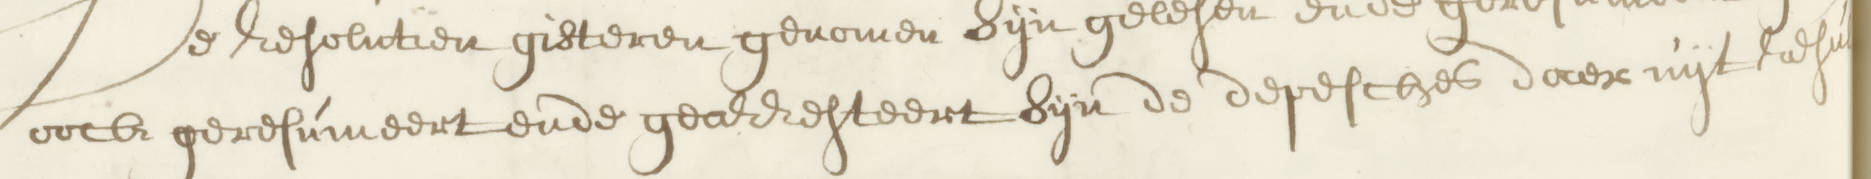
oock geresumeert ende gearresteert sijn de depesches daer uijt resu[l„]
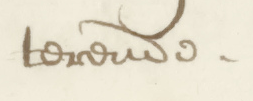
terende.
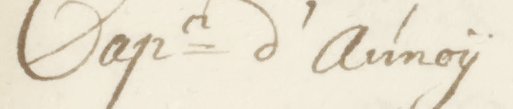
Capn. d'Aunoij
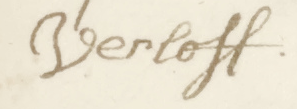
Verloff
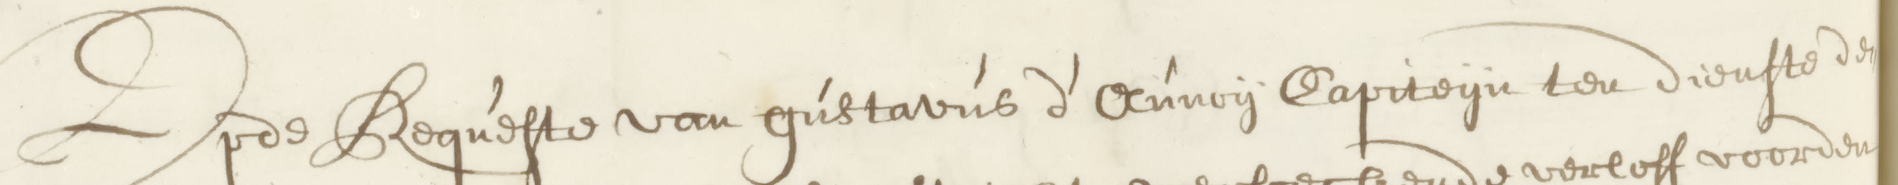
Opde Requeste van Gustavus d'Aunoij Capiteijn ten dienste de„
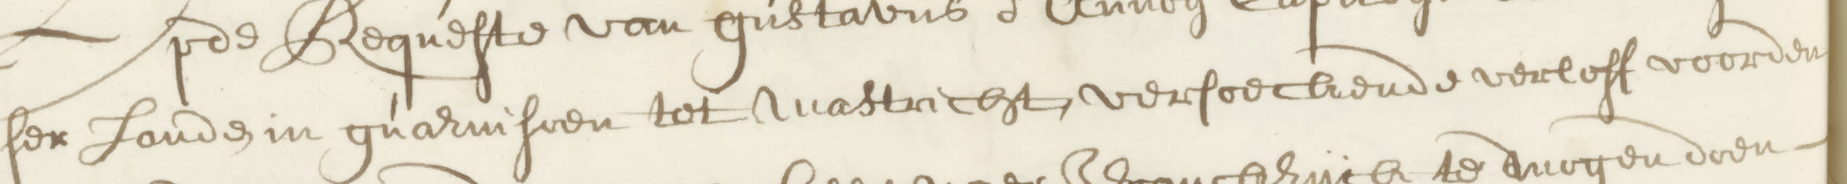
ser Landen in guarnisoen tot mastricht, versoeckende verloff voor den
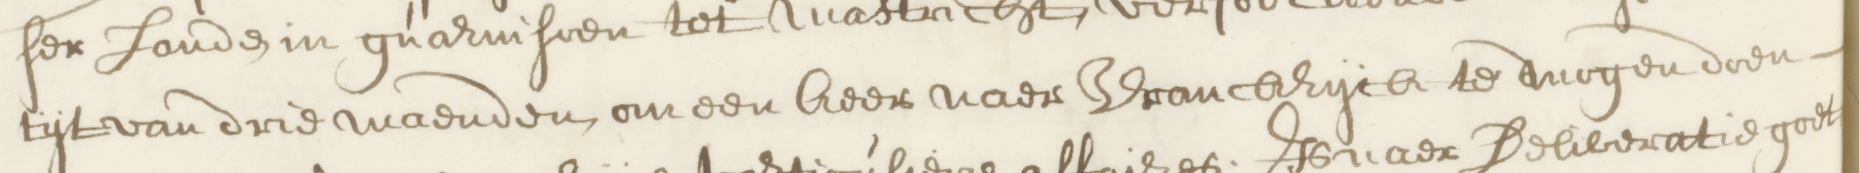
tijt van drie maenden om een keer naer Vranckrijck te mogen doen —
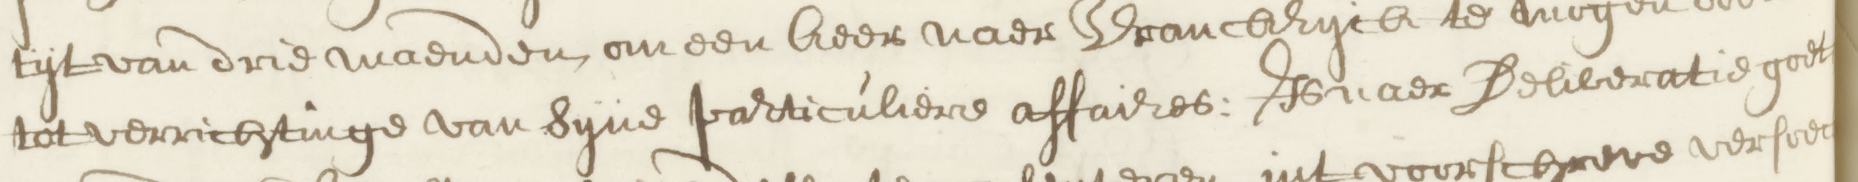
tot verrichtinge van sijne particuliere affaires: Is naer Deliberatie goet
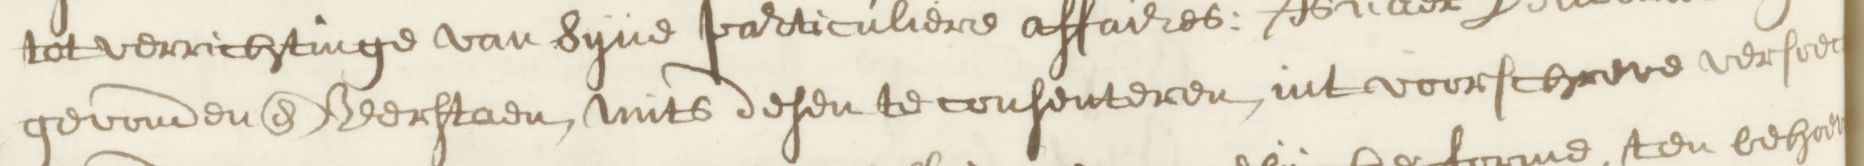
gevonden & verstaen, mits desen te consenteren int voorschreve versoec
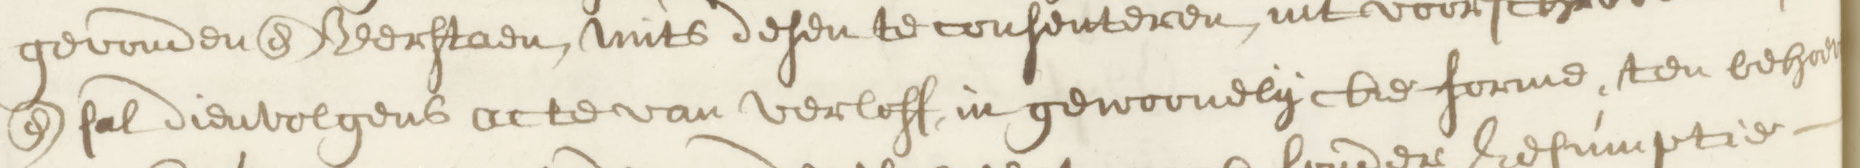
& sal dienvolgens acte van verloff, in gewoonelijcke forme, ten behoe
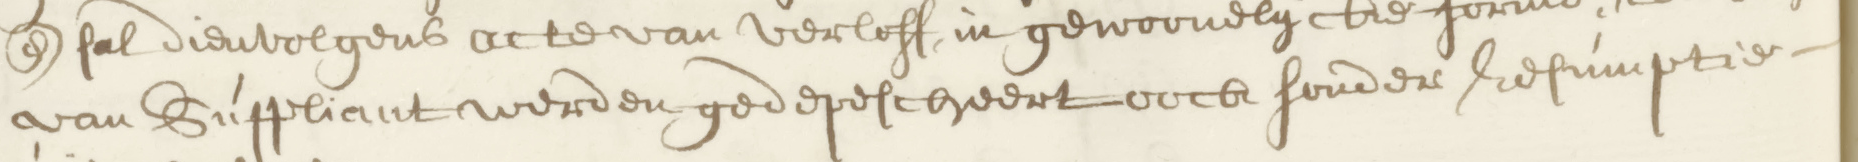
van Suppliant werden gedepescheert oock sonder resumptie —
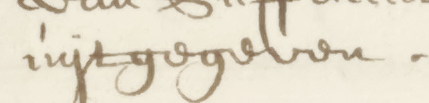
uijtgegeven.
